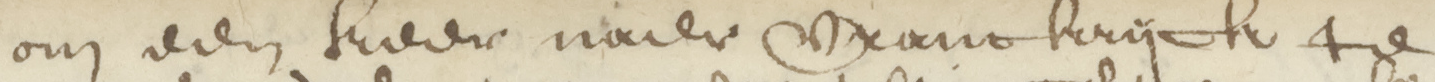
om een keer naer Vranckrijck te
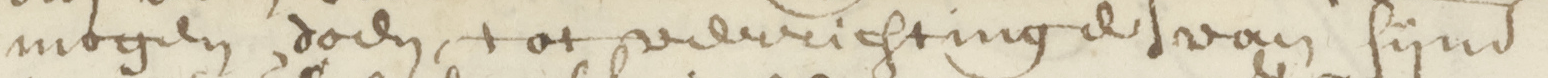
mogen doen, tot verrichtinge van sijne
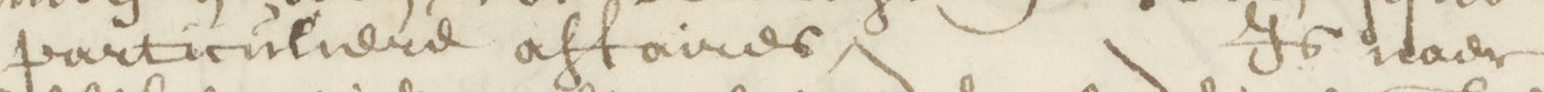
particuliere affaires, Is naer
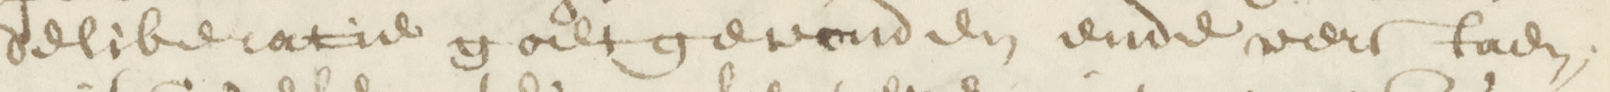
deliberatie goetgevonden ende verstaen;
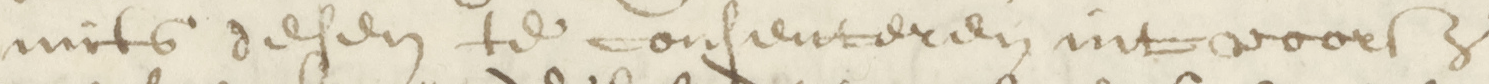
mits desen te consenteren int voors
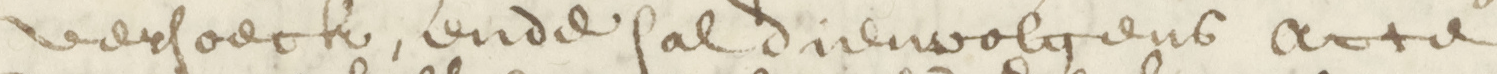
versoeck, ende sal dienvolgens Acte
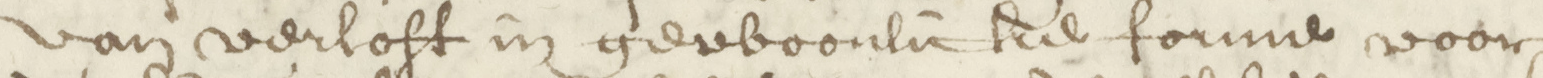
van verloff in gewoonlicke forme voor
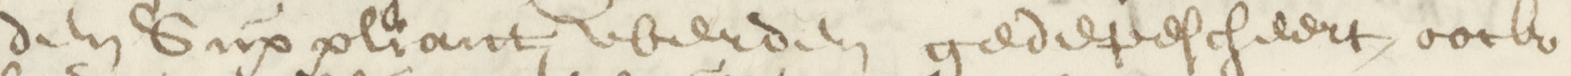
den Suppliant werden gedepescheert, oock
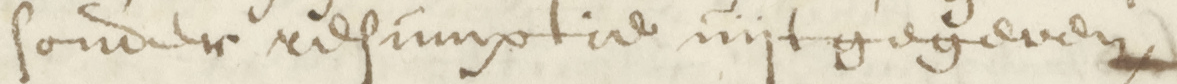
sonder resumptie uijtgegeven.
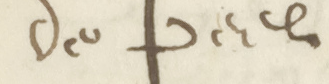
de Peel
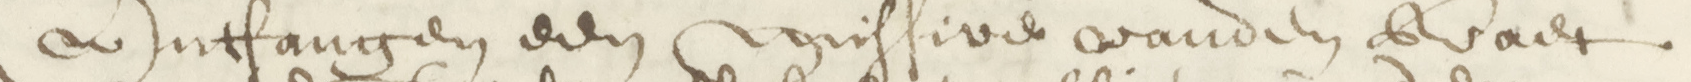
Ontfangen een Missive vanden Raet
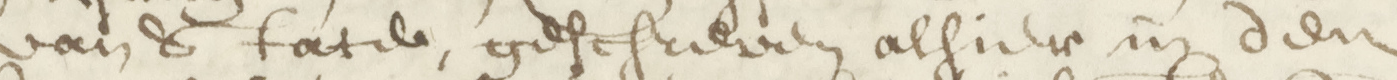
van State, geschreven alhier in den
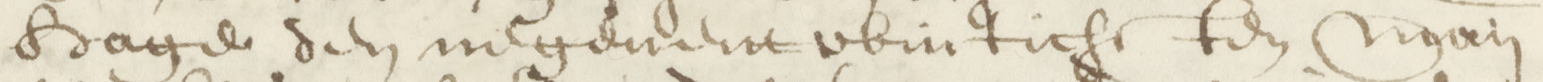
Hage den negenentwintichsten Maij
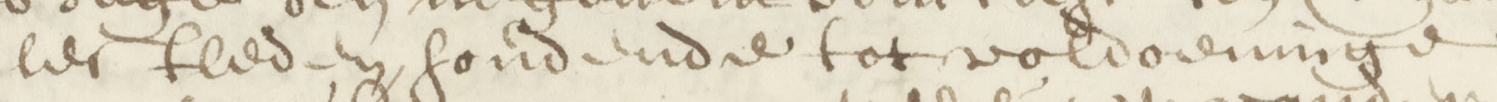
lestleden, houdende tot voldoeninge
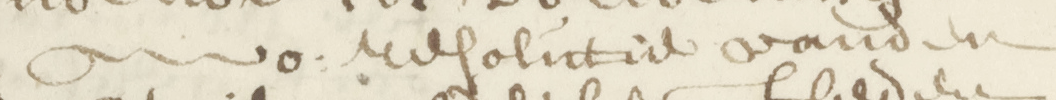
van hare Ho:Mo: resolutie vanden
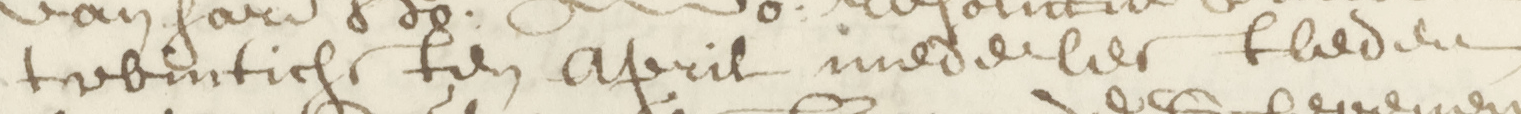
twintichsten April mede lestleden,
